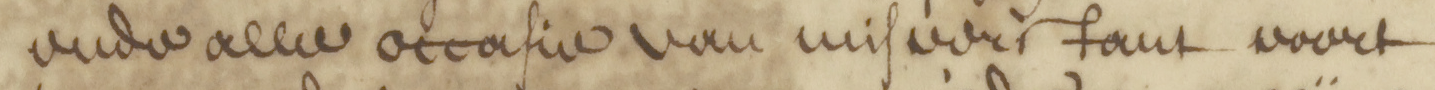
ende alle occasie van misverstant voort
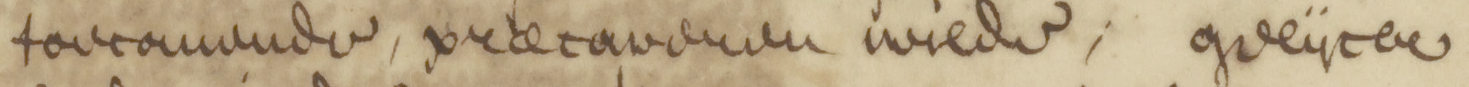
toecomende, præcaveren wilde; gelijck
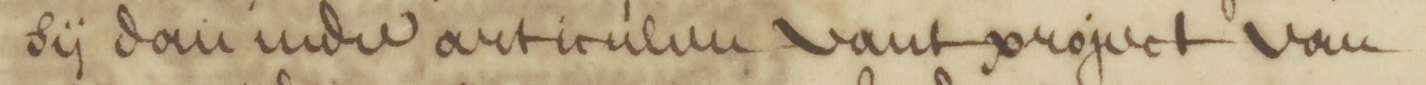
Sij dan inde articulen vant project van
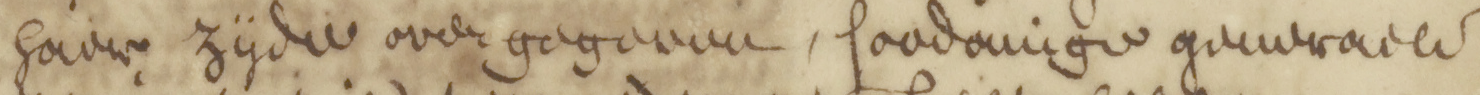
haer zijde overgegeven, soodanige generaele
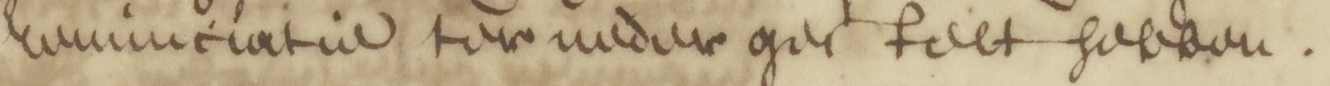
renunciatie ter neder gestelt hebben.
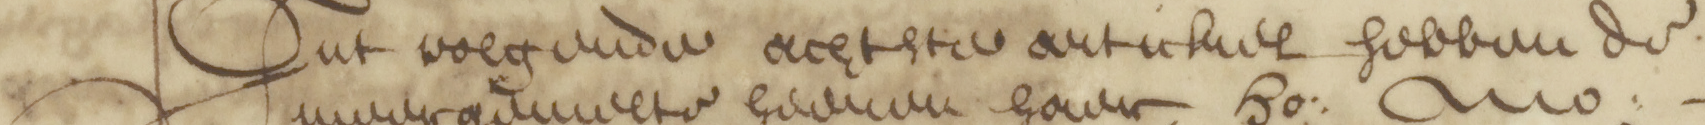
Int volgende achtste artickel hebben de
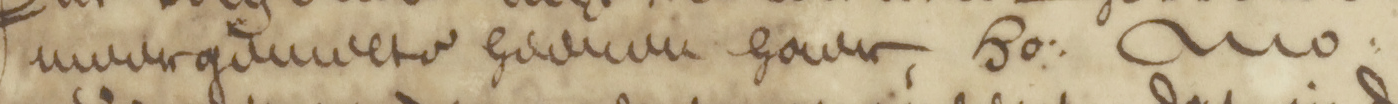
meergemelte heeren haer Ho:Mo:
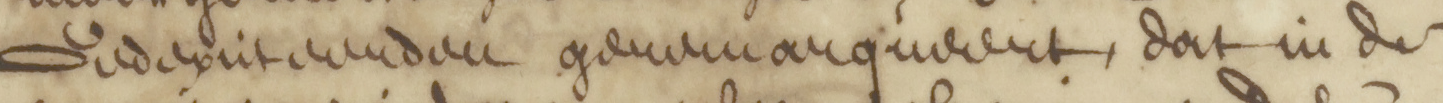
Gedeputeerden geremarqueert, dat in de
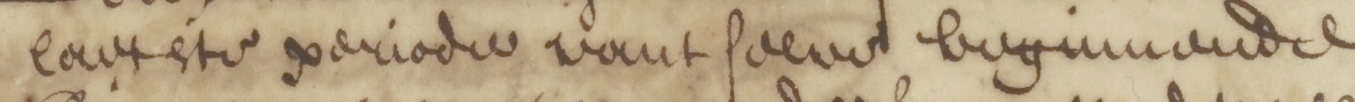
laetste periode vant selve beginnende
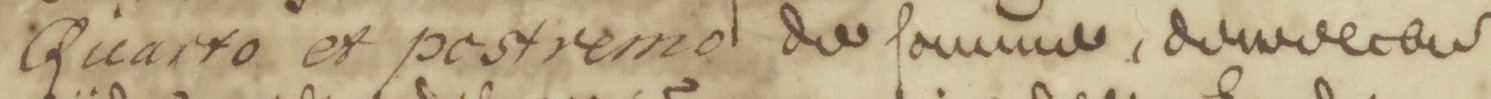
Quarto et postremo de somme, dewelcke
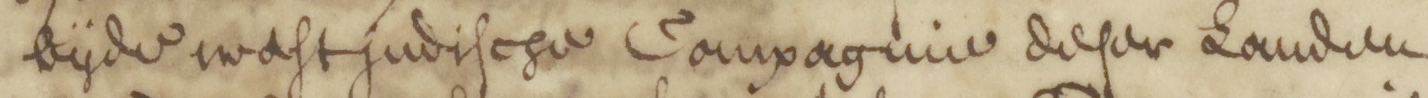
bijde westindische Compagnie deser Landen
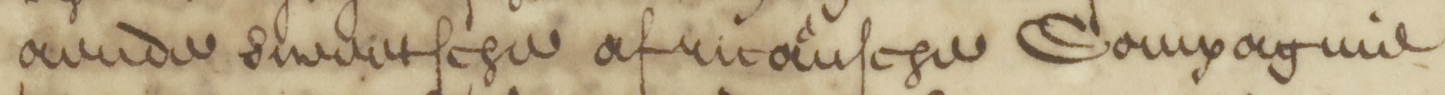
aende Sweetsche africænsche Compagnie
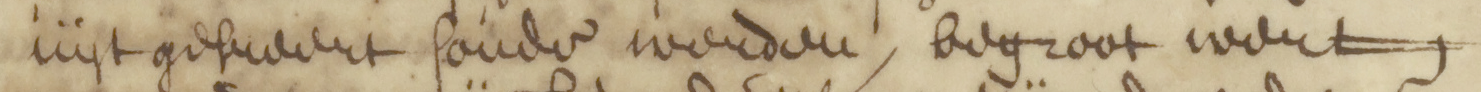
uijt gekeert soude werden begroot wert,
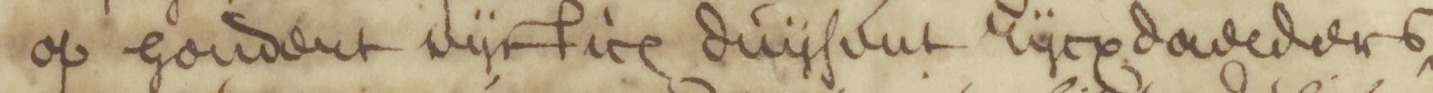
op hondert vijftich duijsent rijcxdaelders
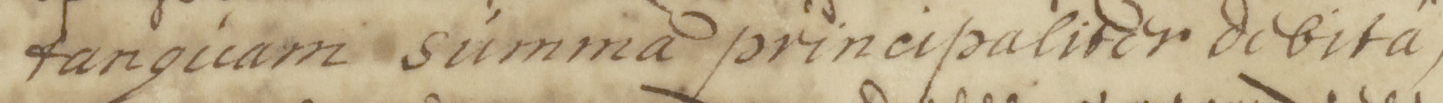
tanquam summa principaliter debitâ
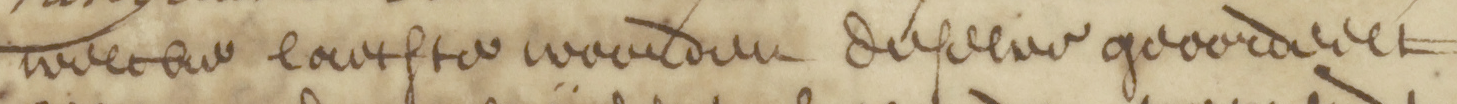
welcke laetste woorden deselve geoordeelt
